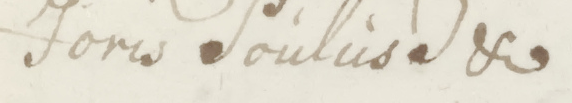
Joris Poulus &
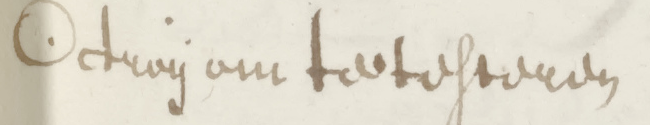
Octroij om te testeren
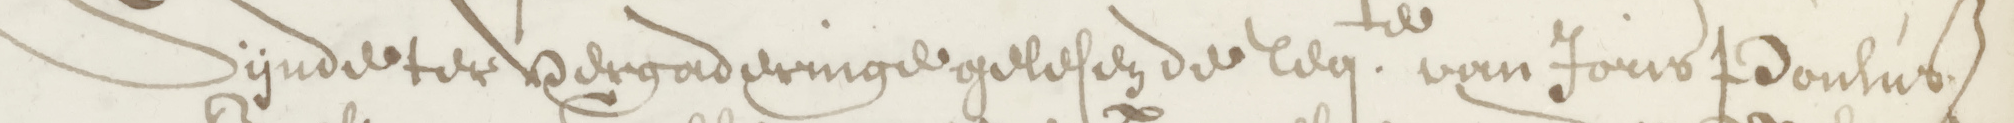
Sijnde ter vergaderinge gelesen de reqte van Joris Pouluss
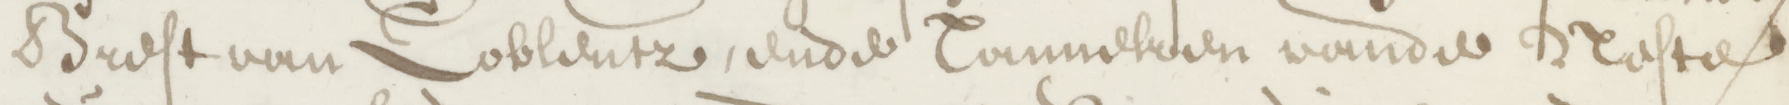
Brest van Coblentz, ende Tanneken vande Neste
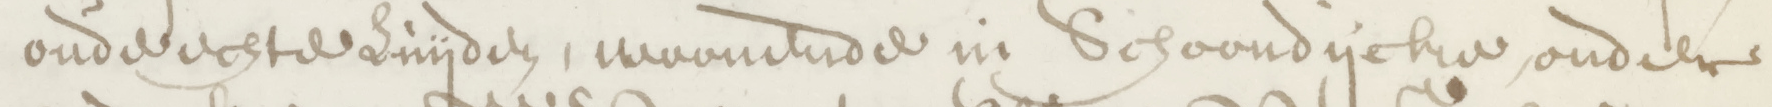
oude echte Luijden, woonende in Schoondijcke, onder
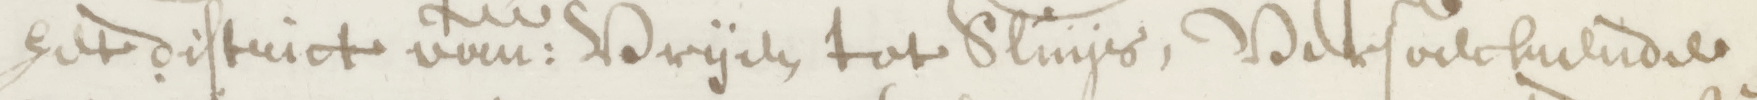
het district van Vrijen tot Sluijs, Versoeckende
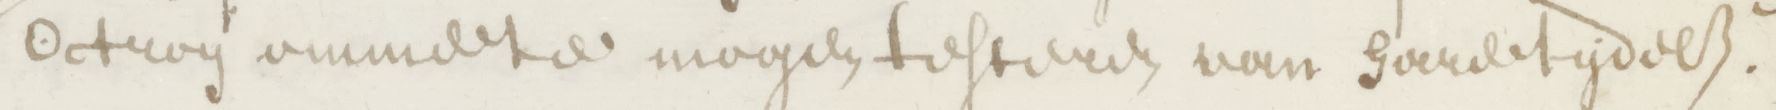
Octroij omme te mogen testeren van hare tijdele
